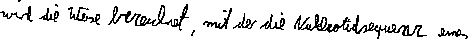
wird die Weise bezeichnet, mit der die Nukleotidsequenz eines
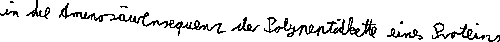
in die Aminosäurensequenz der Polypeptidkette eines Proteins
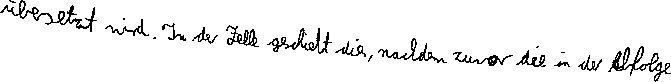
übersetzt wird. In der Zelle geschieht dies, nachdem zuvor die in der Abfolge
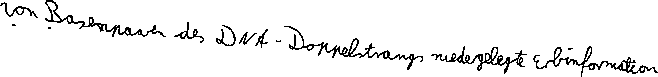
von Basenpaaren des DNA-Doppelstrangs niedergelegte Erbinformation
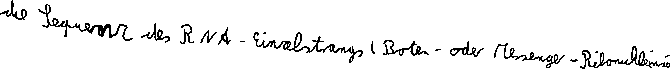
in die Sequenz des RNA-Einzelstrangs (Boten- oder Messenger-Ribonukleinsäure
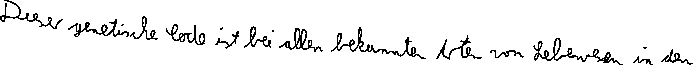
Dieser genetische Code ist bei allen bekannten Arten von Lebewesen in den
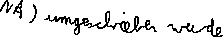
NA) umgeschrieben wurde
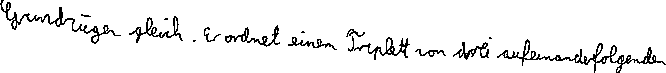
Grundzügen gleich. Er ordnet einem Triplett von drei aufeinanderfolgenden
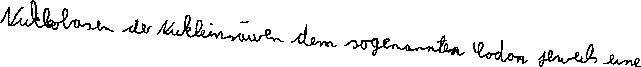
Nukleobasen der Nukleinsäuren dem sogenannten Codon jeweils eine
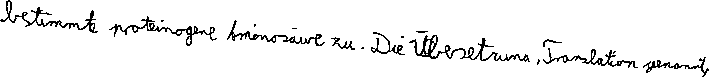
bestimmte proteinogene Aminosäure zu. Die Übersetzung, Translation genannt,
